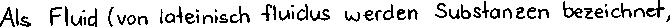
Als Fluid (von lateinisch fluidus werden Substanzen bezeichnet,
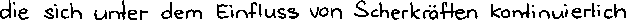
die sich unter dem Einfluss von Scherkräften kontinuierlich
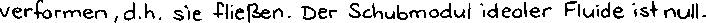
verformen, d. h. sie fließen. Der Schubmodul idealer Fluide ist null.
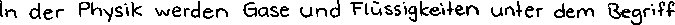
In der Physik werden Gase und Flüssigkeiten unter dem Begriff
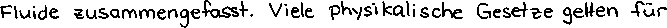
Fluide zusammengefasst. Viele physikalische Gesetze gelten für
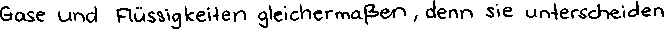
Gase und Flüssigkeiten gleichermaßen, denn sie unterscheiden
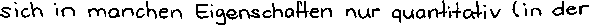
sich in manchen Eigenschaften nur quantitativ (in der
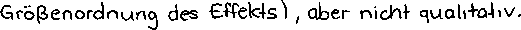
Größenordnung des Effekts), aber nicht qualitativ.
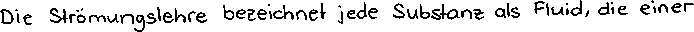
Die Strömungslehre bezeichnet jede Substanz als Fluid, die einer
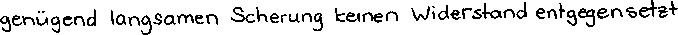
genügend langsamen Scherung keinen Widerstand entgegensetzt
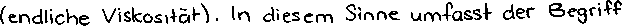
(endliche Viskosität). In diesem Sinne umfasst der Begriff
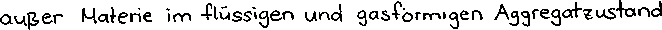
außer Materie im flüssigen und gasförmigen Aggregatzustand
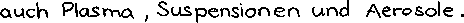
auch Plasma, Suspensionen und Aerosole.
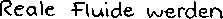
Reale Fluide werden
